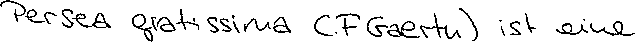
Persea gratissima C.F.Gaertn.) ist eine
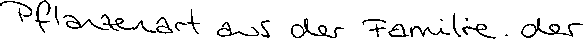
Pflanzenart aus der Familie der
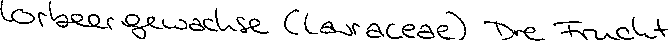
Lorbeergewächse (Lauraceae). Die Frucht
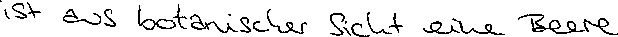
ist aus botanischer Sicht eine Beere
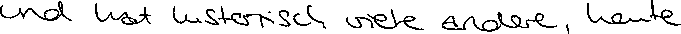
und hat historisch viele andere, heute
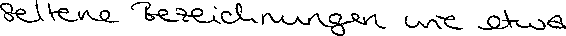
seltene Bezeichnungen wie etwa
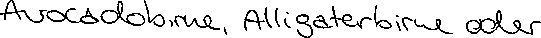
Avocadobirne, Alligatorbirne oder
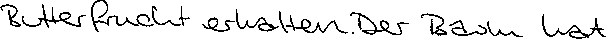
Butterfrucht erhalten.Der Baum hat
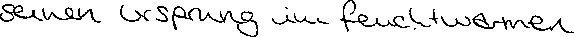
seinen Ursprung im feuchtwarmen
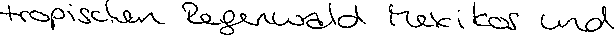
tropischen Regenwald Mexikos und
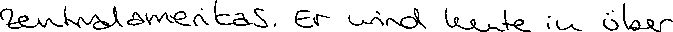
Zentralamerikas. Er wird heute in über
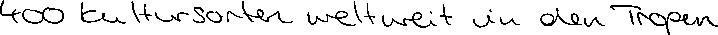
400 Kultursorten weltweit in den Tropen
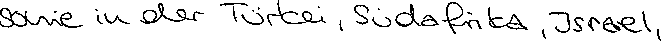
sowie in der Türkei, Südafrika, Israel,
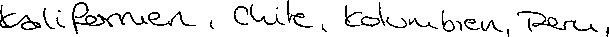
Kalifornien, Chile, Kolumbien, Peru,
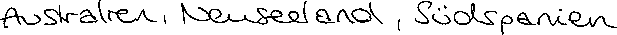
Australien, Neuseeland, Südspanien
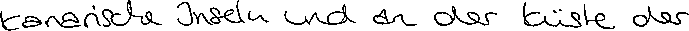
Kanarische Inseln und an der Küste der
